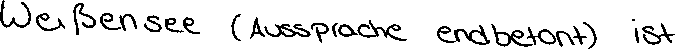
Weißensee (Aussprache endbetont) ist
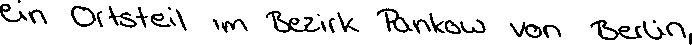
ein Ortsteil im Bezirk Pankow von Berlin,
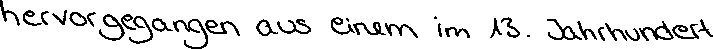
hervorgegangen aus einem im 13. Jahrhundert
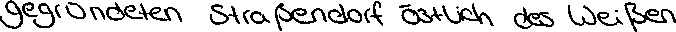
gegründeten Straßendorf östlich des Weißen
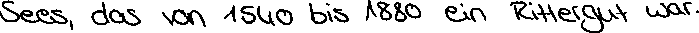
Sees, das von 1540 bis 1880 ein Rittergut war.
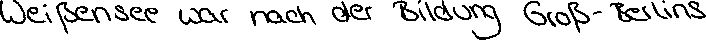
Weißensee war nach der Bildung Groß-Berlins
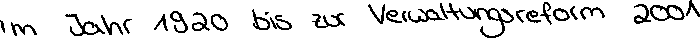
im Jahr 1920 bis zur Verwaltungsreform 2001
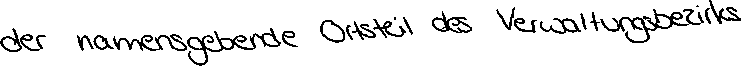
der namensgebende Ortsteil des Verwaltungsbezirks
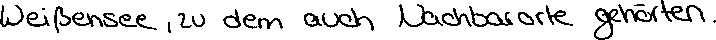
Weißensee, zu dem auch Nachbarorte gehörten.
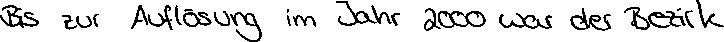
Bis zur Auflösung im Jahr 2000 war der Bezirk
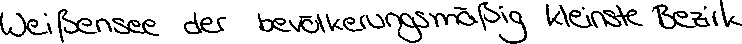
Weißensee der bevölkerungsmäßig kleinste Bezirk
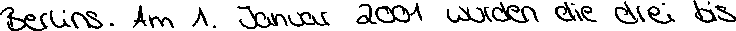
Berlins. Am 1. Januar 2001 wurden die drei bis
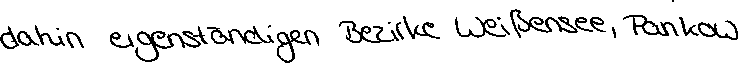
dahin eigenständigen Bezirke Weißensee, Pankow
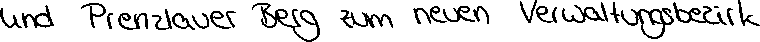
und Prenzlauer Berg zum neuen Verwaltungsbezirk
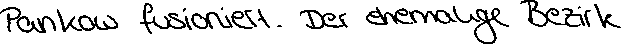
Pankow fusioniert. Der ehemalige Bezirk
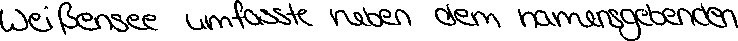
Weißensee umfasste neben dem namensgebenden
